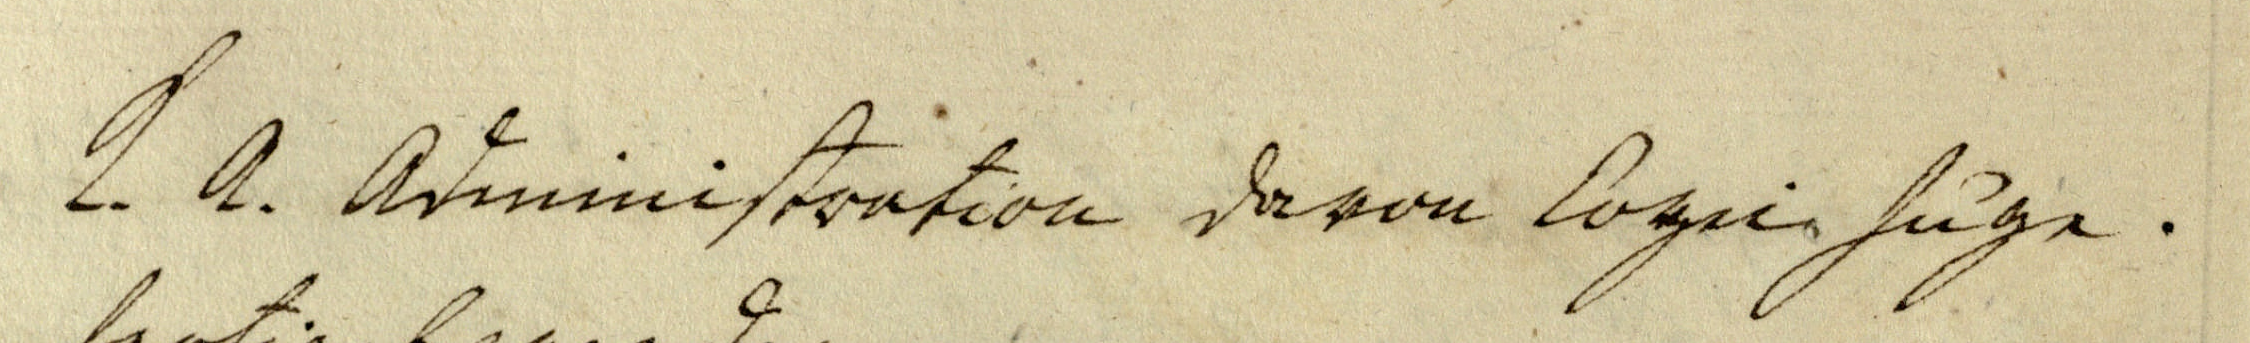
K. A. Administration davon Copei zuge¬
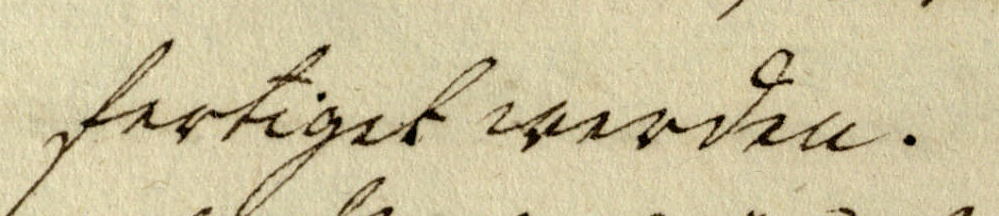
fertiget werden.
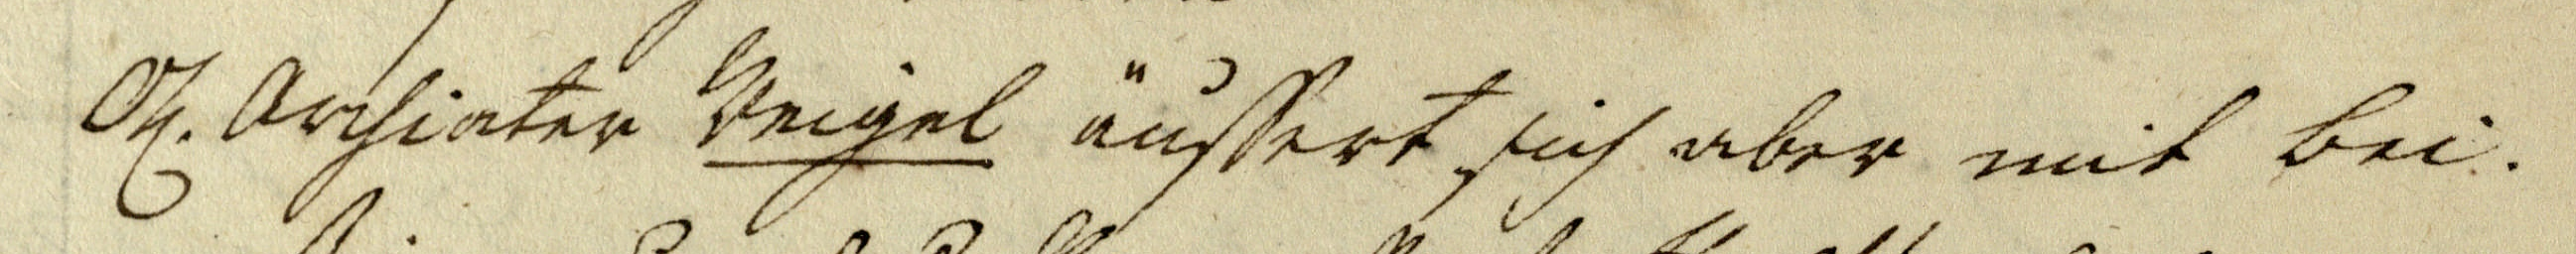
dh. Archiater Weigel äussert sich aber mit Bei¬
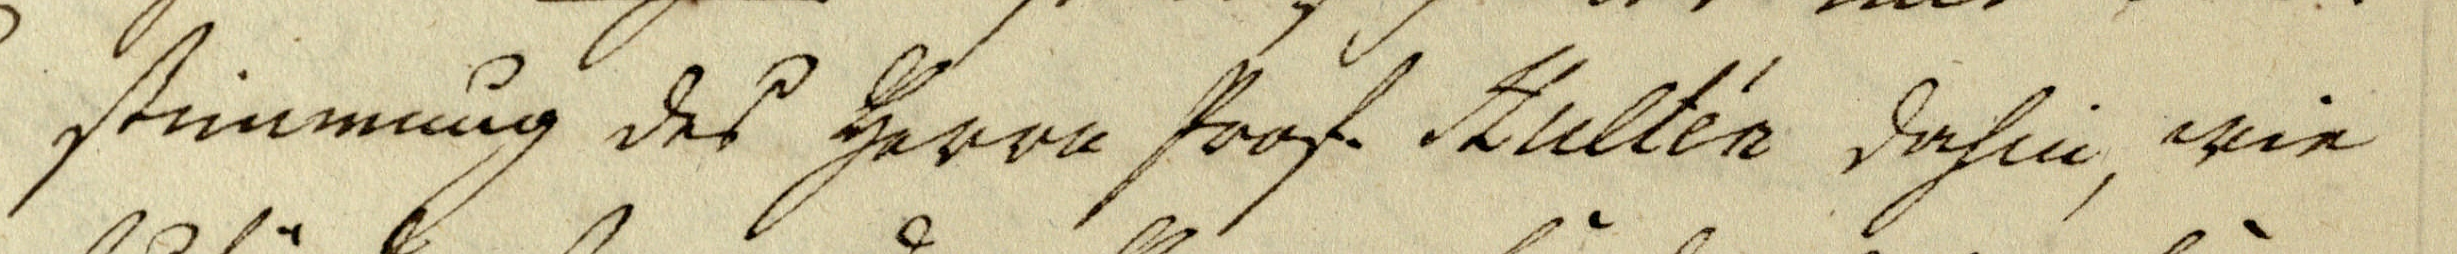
stimmung des Herrn Prof. Hultén dahin, wie
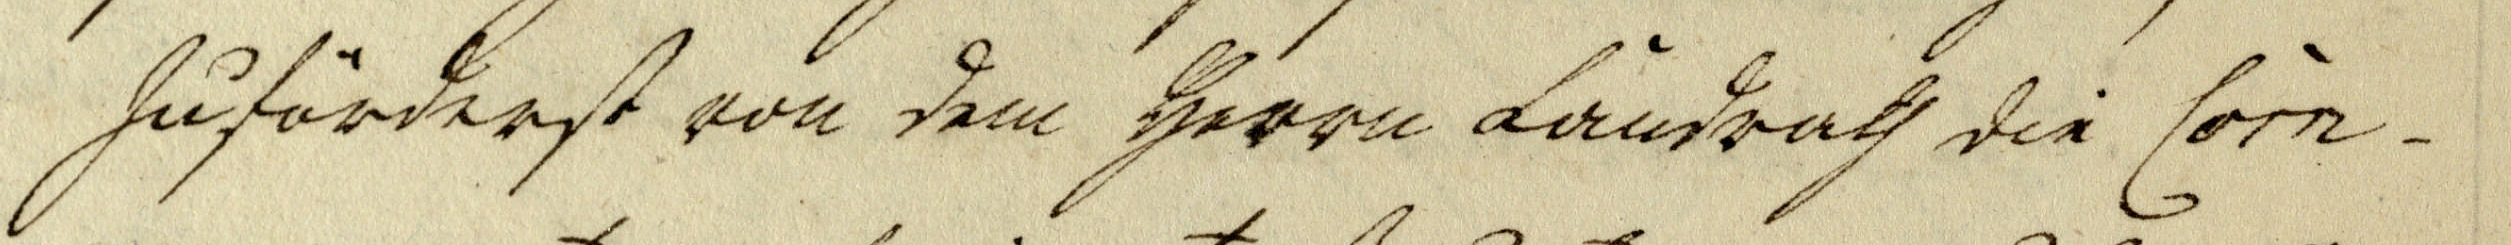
zuförderst von dem Herrn Landrath die Com¬
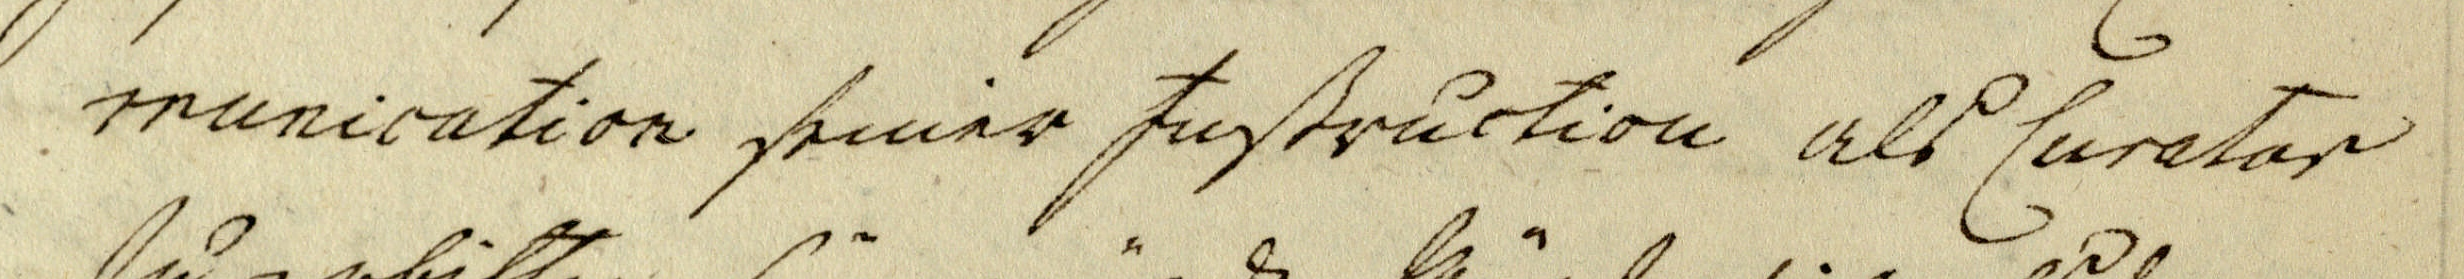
munication seiner Instruction als Curator
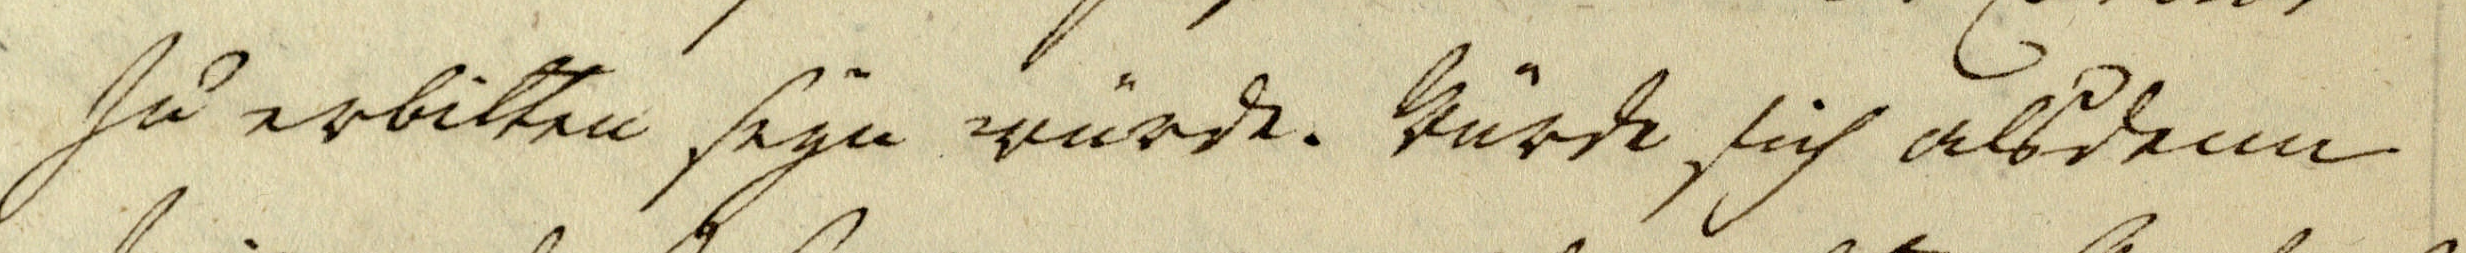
zu erbitten seÿn würde. Würde sich alsdenn
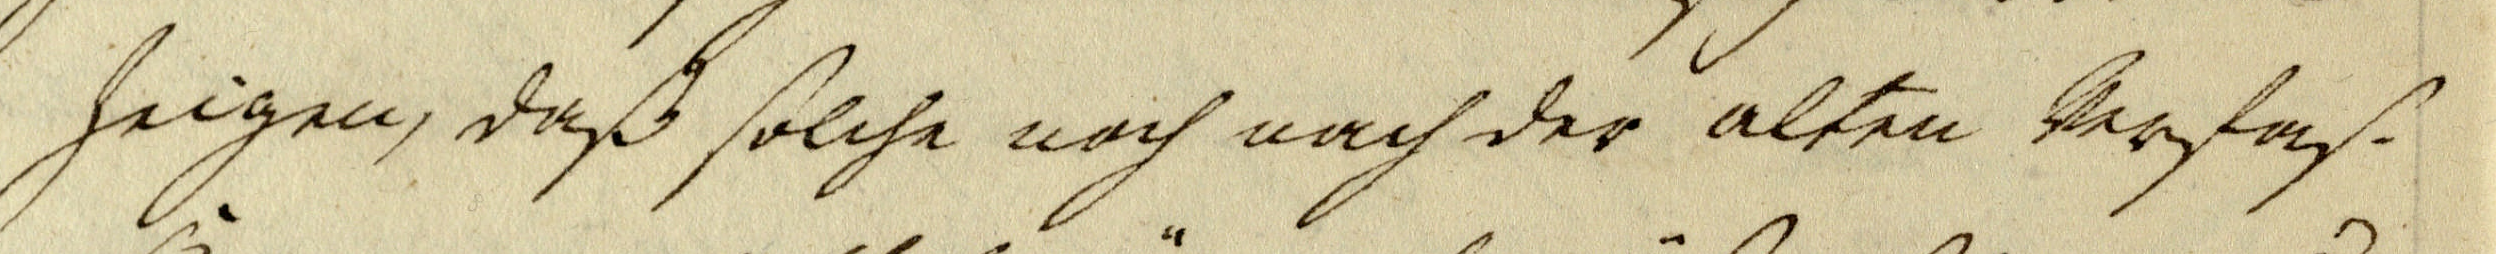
zeigen, daß solche noch nach der alten Verfas¬
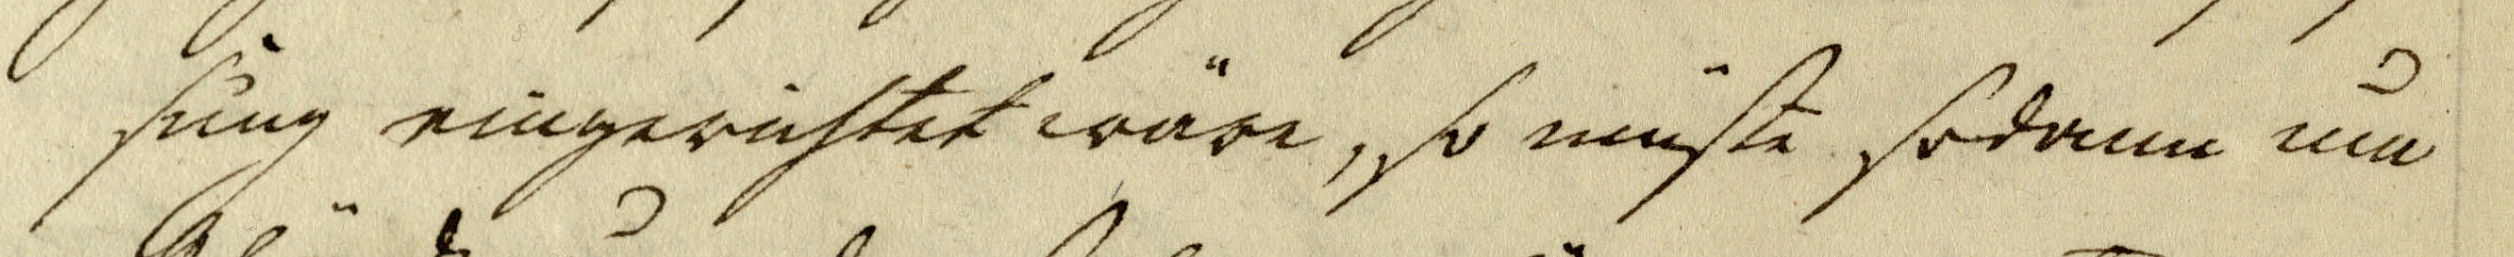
sung eingerichtet wäre, so müßte sodann um
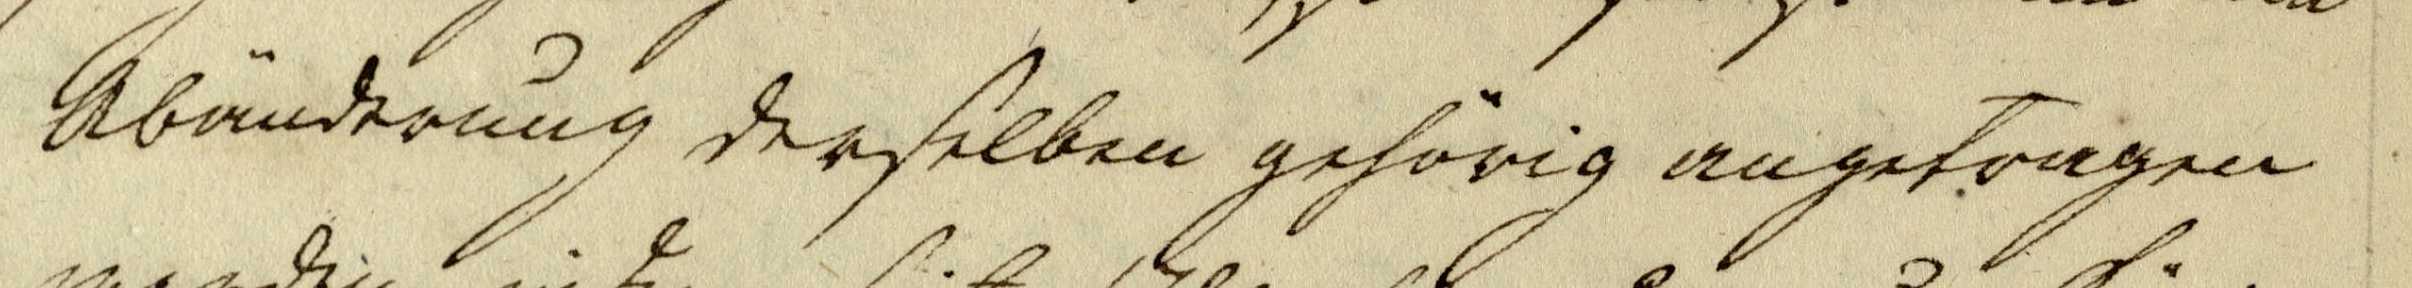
Abänderung derselben gehörig angetragen
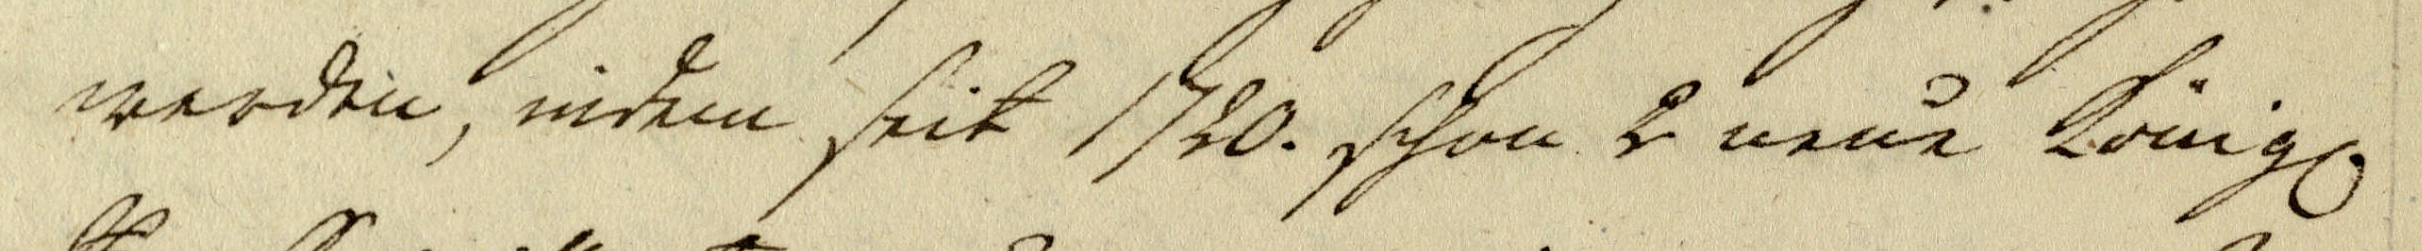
werden, indem seit 1720. schon 2 neue Königl.
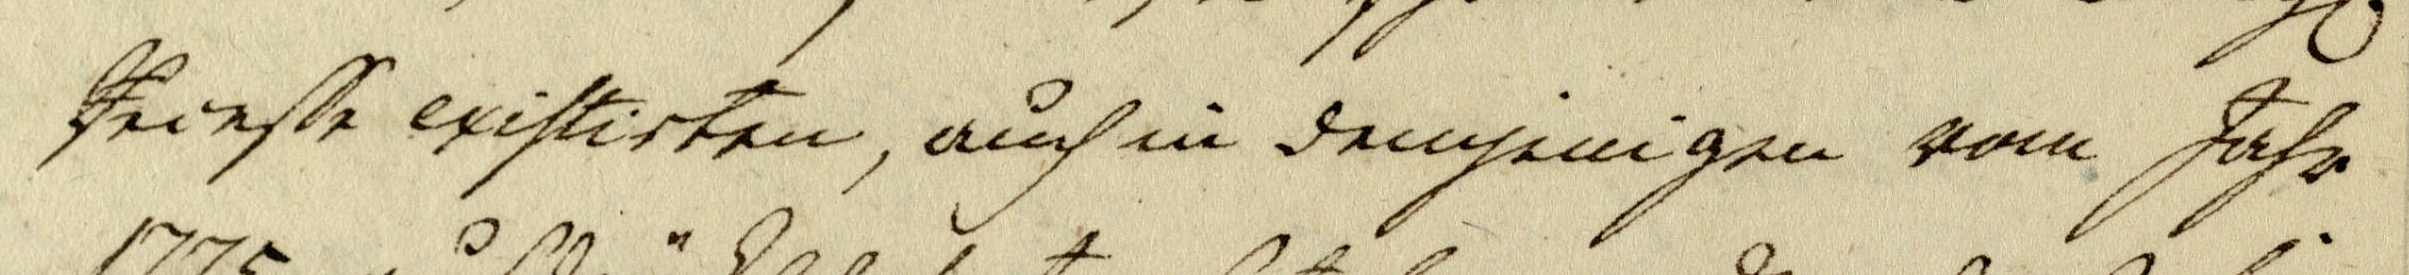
Recesse existirten, auch in demjenigen vom Jahr
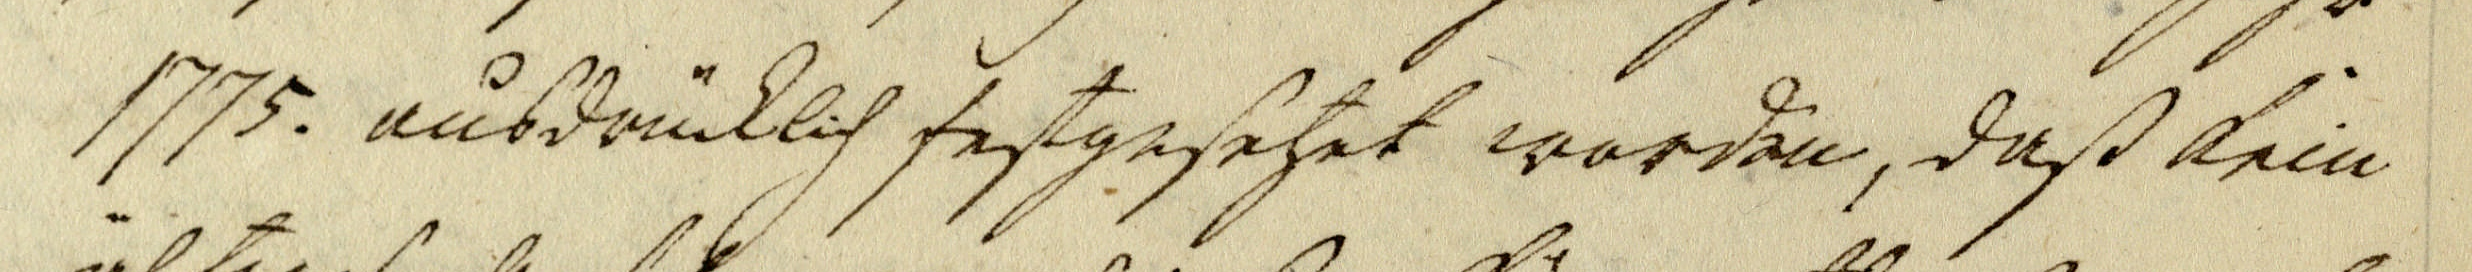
1775. ausdrücklich festgesetzet worden, daß kein
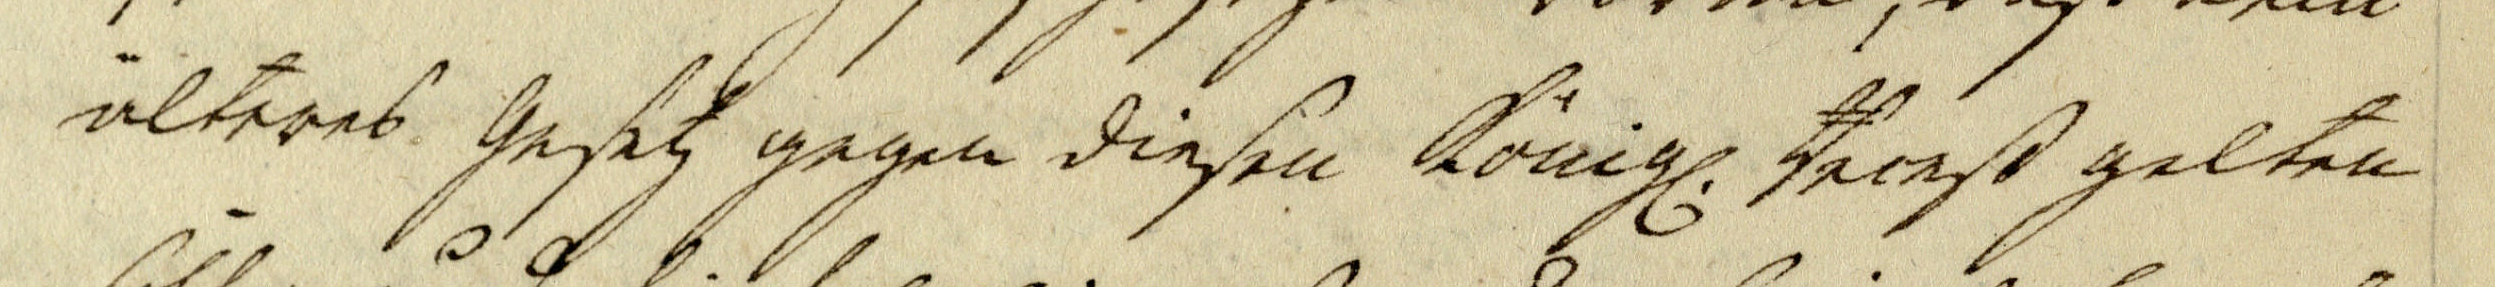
älteres Gesetz gegen diesen Königl. Receß gelten
